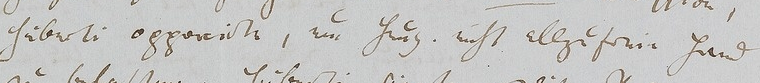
Häberli opponirte, um Hung. nicht allzu freie Hand
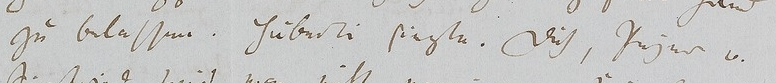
zu belassen. Häberli siegte. Dich, Peyer &.
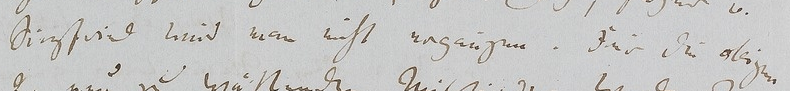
Siegfried wird man nicht ergänzen. Für die obigen
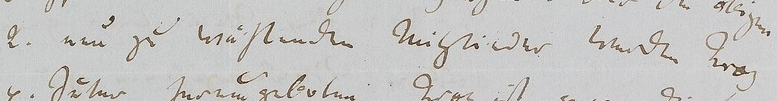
2. neu zu wählenden Mitglieder werden Trog
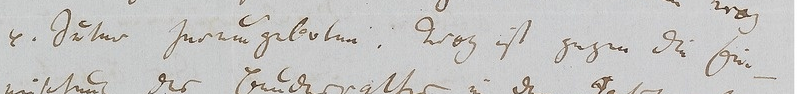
&. Suter herumgeboten. Trog ist gegen die Ein-
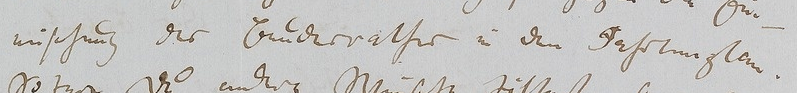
mischung des Bundesrathes in den Fahrtenplan.
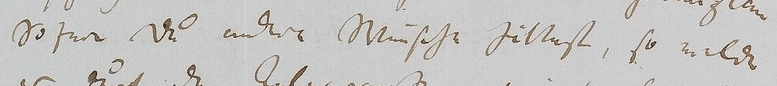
Sofern Du andere Wünsche hättest, so melde
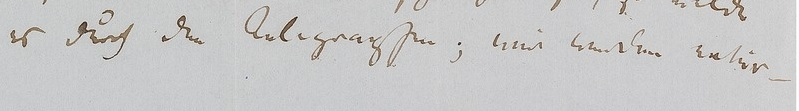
es durch den Telegraphen; wir werden natür-
